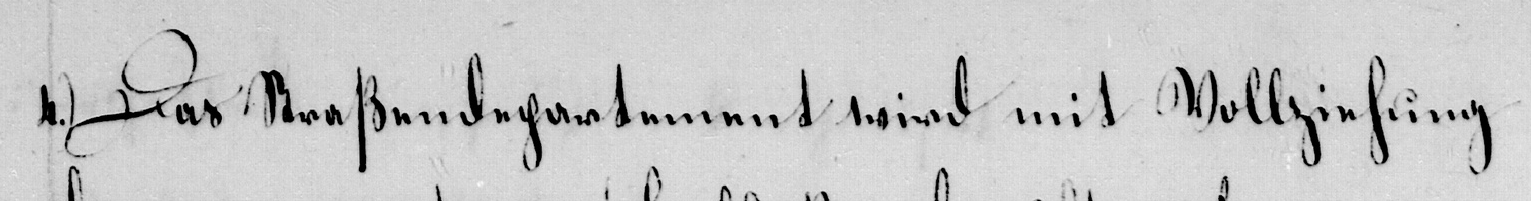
4.) Das Straßendepartement wird mit Vollziehung
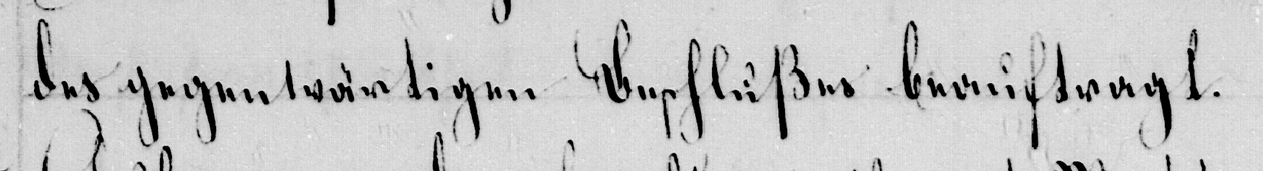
des gegenwärtigen Beschlußes beauftragt.
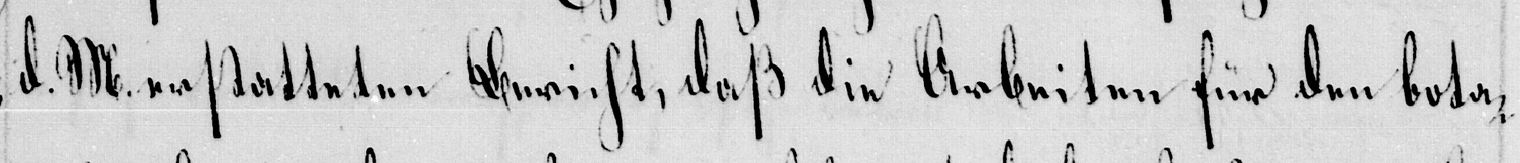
d. M. erstatteten Bericht, daß die Arbeiten für den bota¬
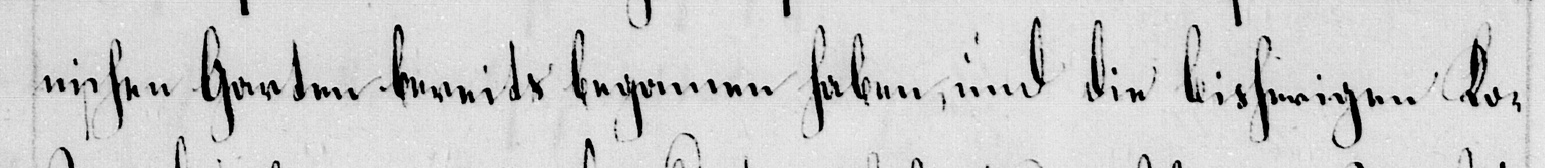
nischen Garten bereits begonnen haben, und die bisherigen Ko¬
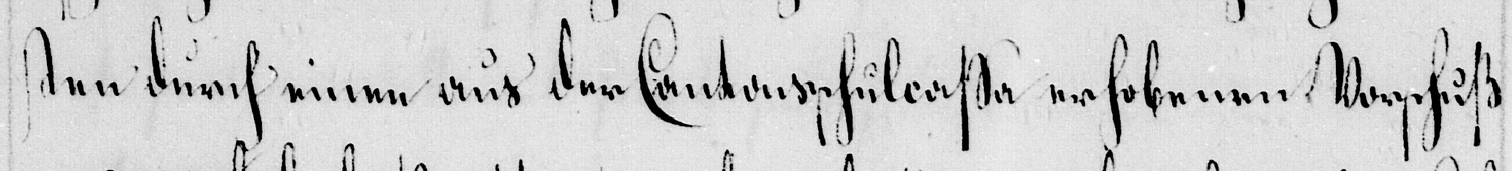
sten durch einen aus der Cantonsschulcaßa erhobenen Vorschuß
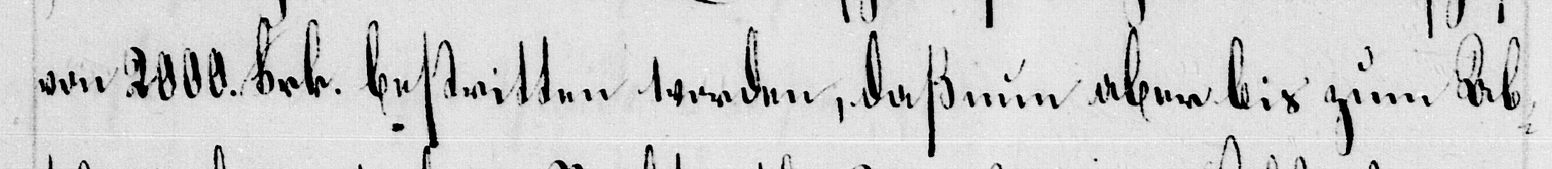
von 200. Frk. bestritten werden, daß nun aber bis zum Ab¬
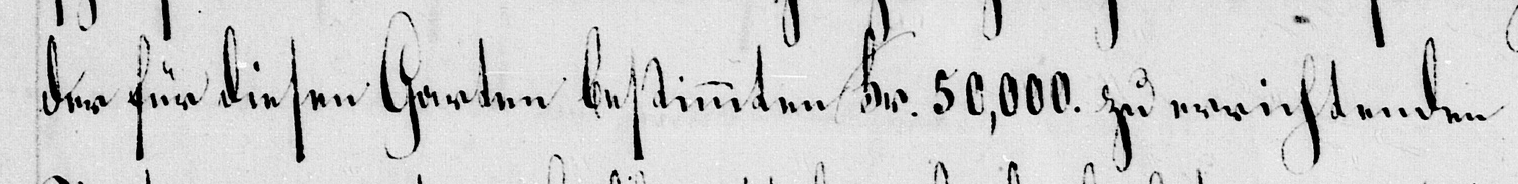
der für diesen Garten bestimmten Fr. 50,000. zu errichtenden
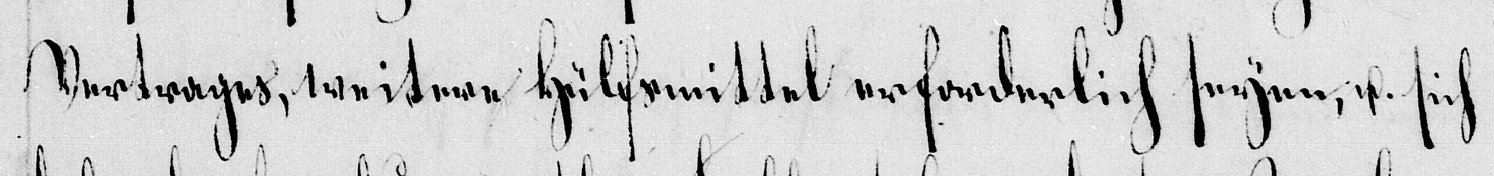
Vertrages, weitere Hülfsmittel erforderlich seyen, u. sich
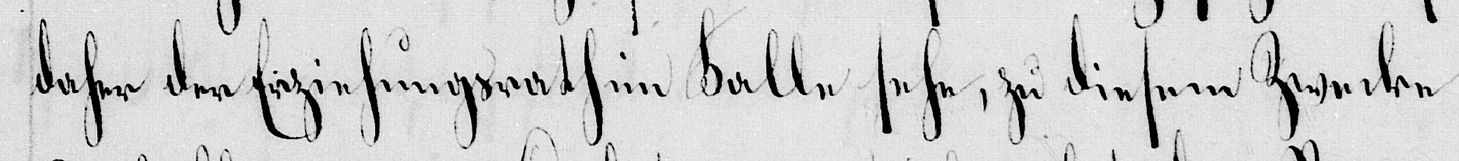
daher der Erziehungsrath im Falle sehe, zu diesem Zwecke
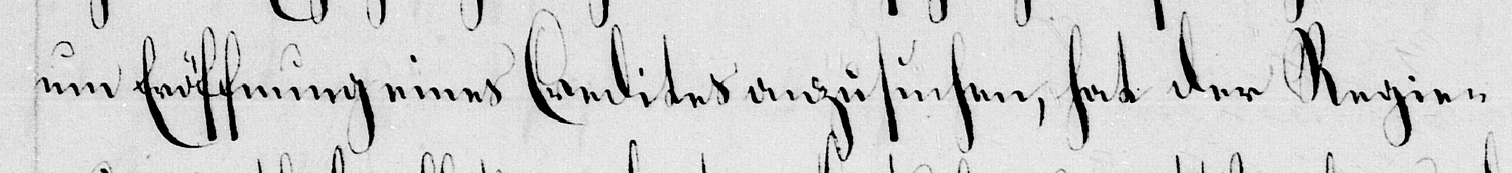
um Eröffnung eines Credites anzusuchen, hat der Regie¬
